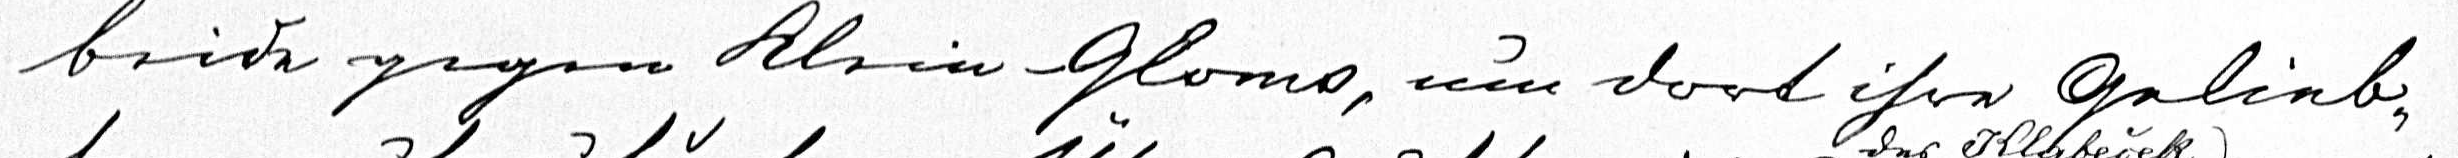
beide gegen Klein Gloms, um dort ihre Gelieb¬
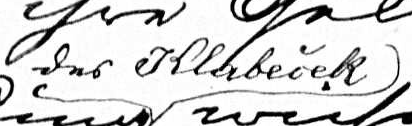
des Klabeček
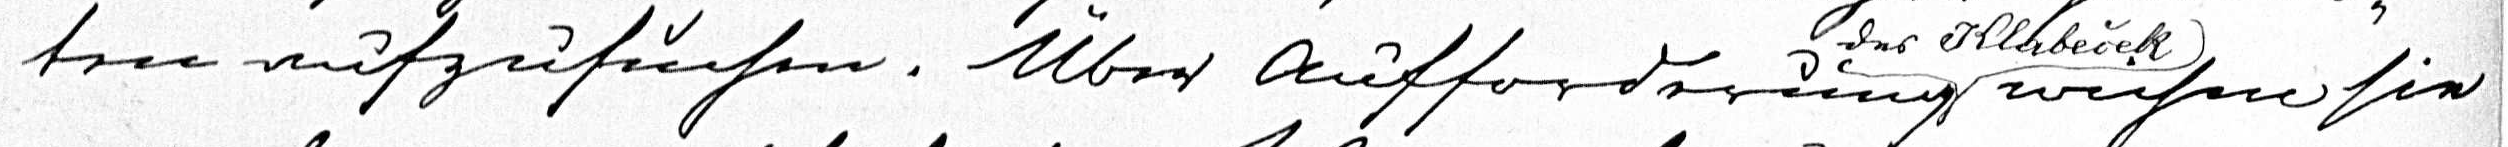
ten aufzusuchen. Über Aufforderung, wichen sie
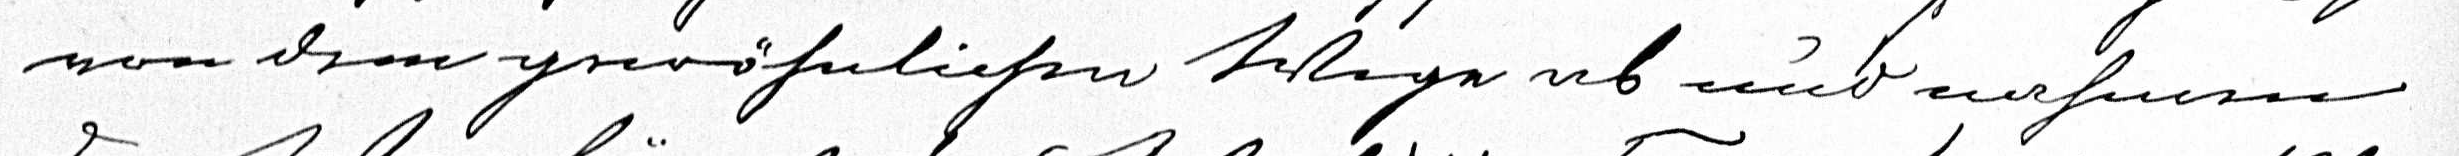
von dem gewöhnlichen Wege ab und nahmen
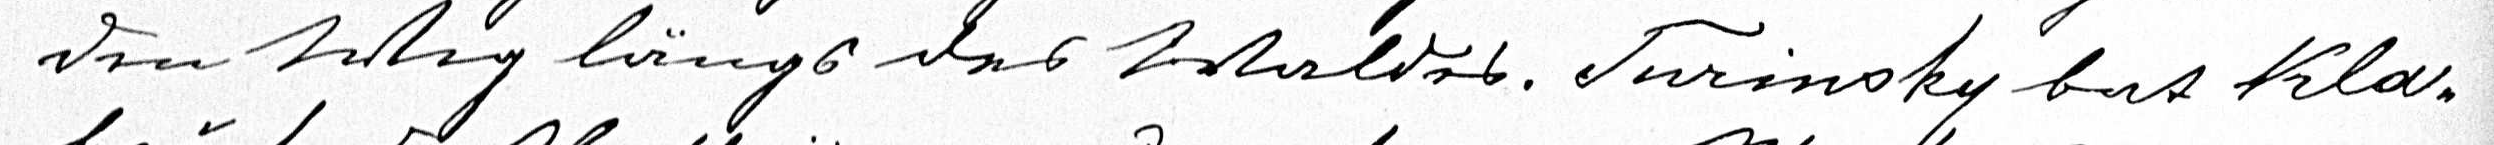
den Weg längs des Waldes. Turinsky bat Kla¬
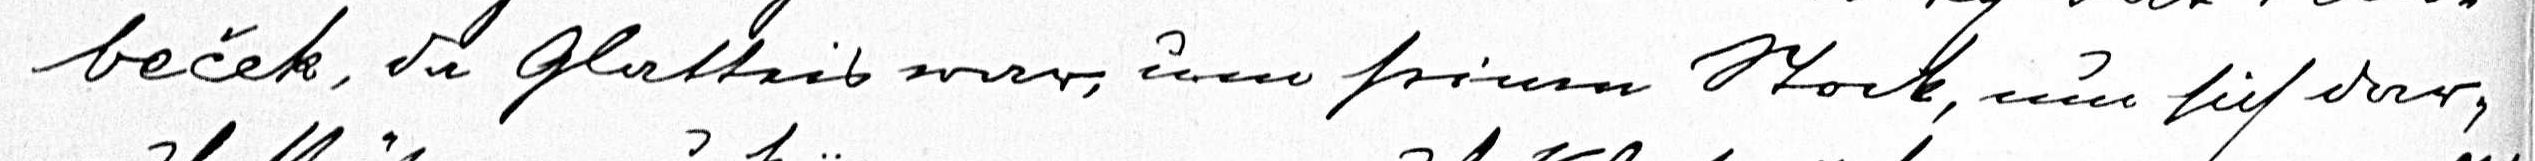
beček, da Glatteis war, um seinen Stock, um sich dar¬
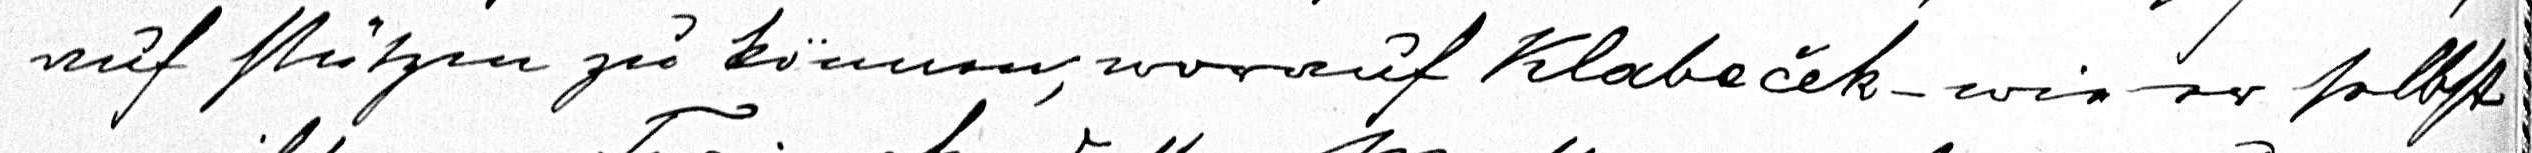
auf Stützen zu können, worauf Klabeček – wie er selbst
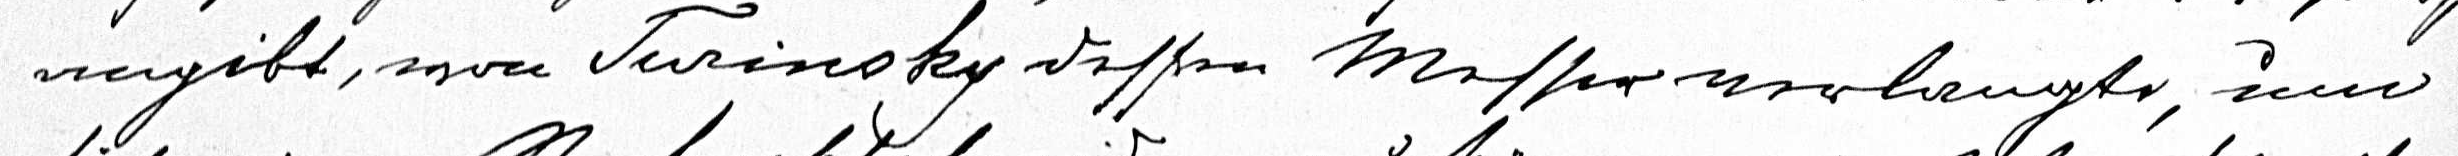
angibt, von Turinsky dessen Messer verlangt, um
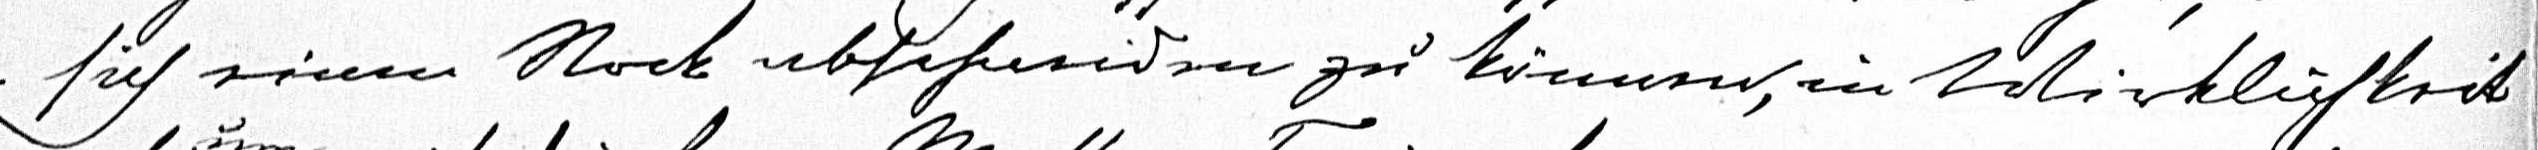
sich einen Stock abschneiden zu können, in Wirklichkeit
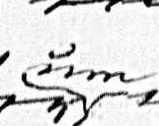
um
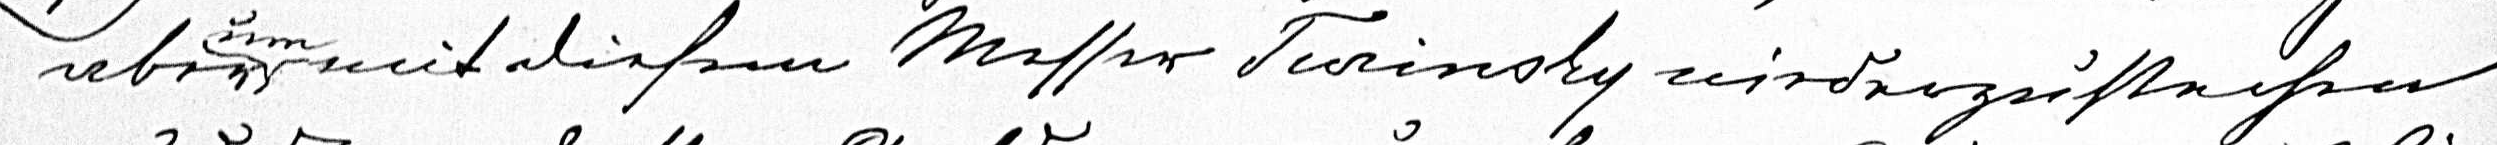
aber mit diesem Messer Turinsky niederzustechen
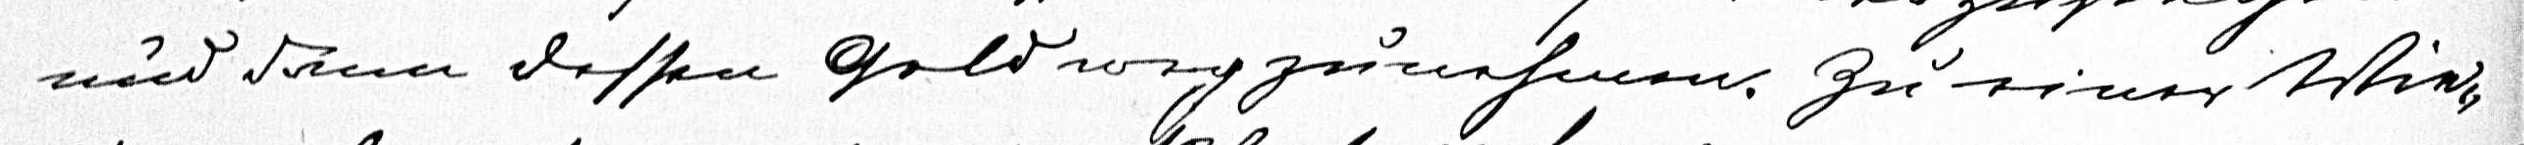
und dann dessen Geld wegzunehmen. Zu einer Wie¬
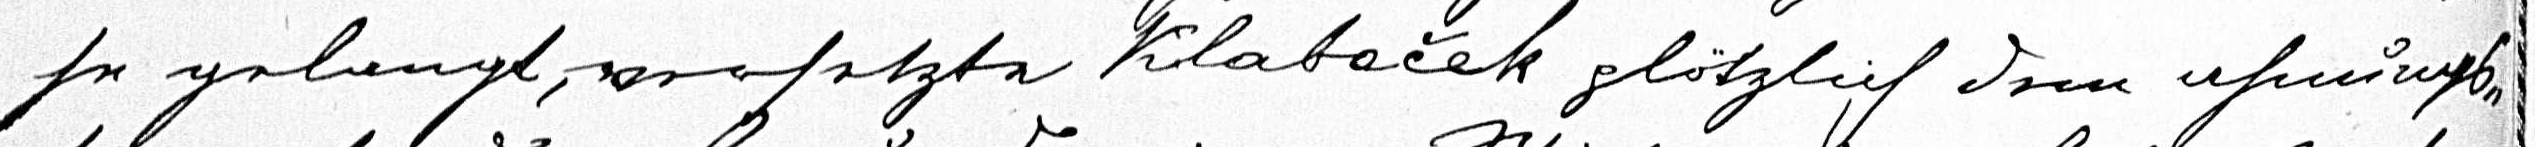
se gelangt, versetzte Klabeček plötzlich dem ahnungs¬
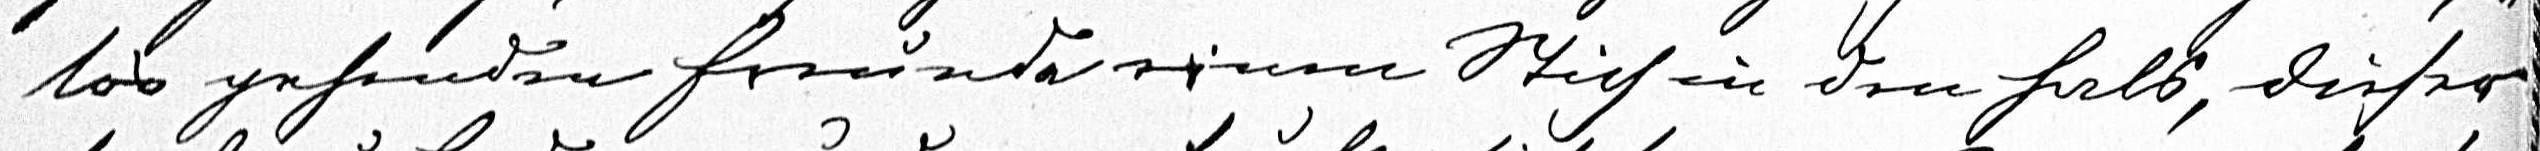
los gehenden Freunde einen Stich in den Hals, dieser
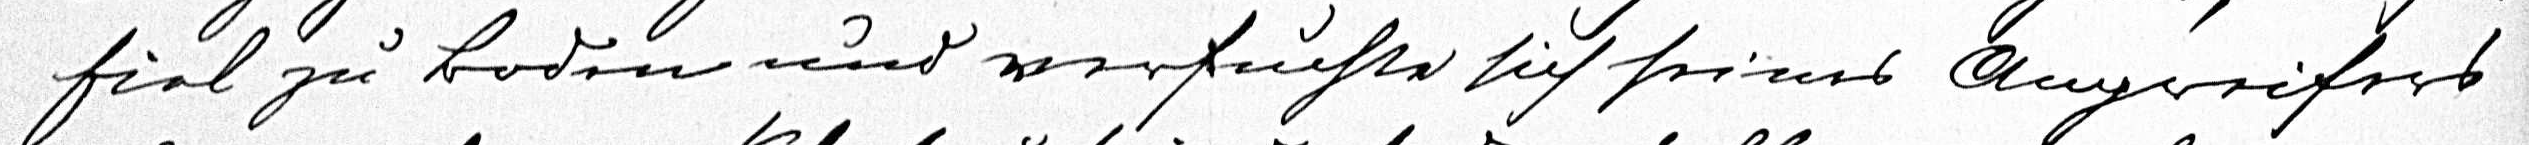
fiel zu Boden und versuchte sich seines Angreifers
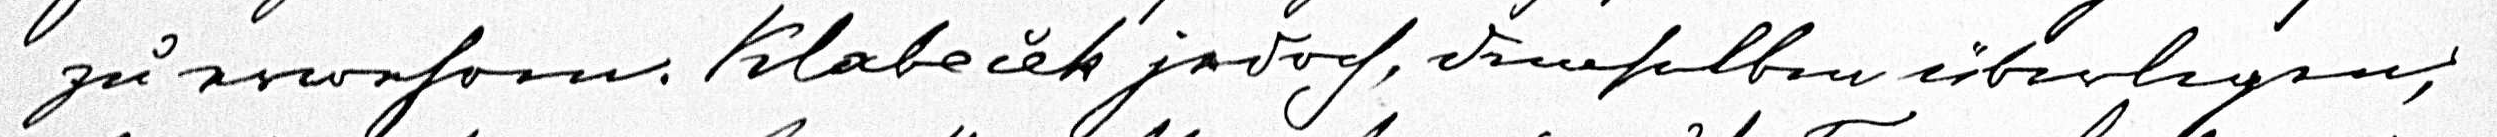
zu erwehren. Klabeček jedoch, demselben überlegen,
